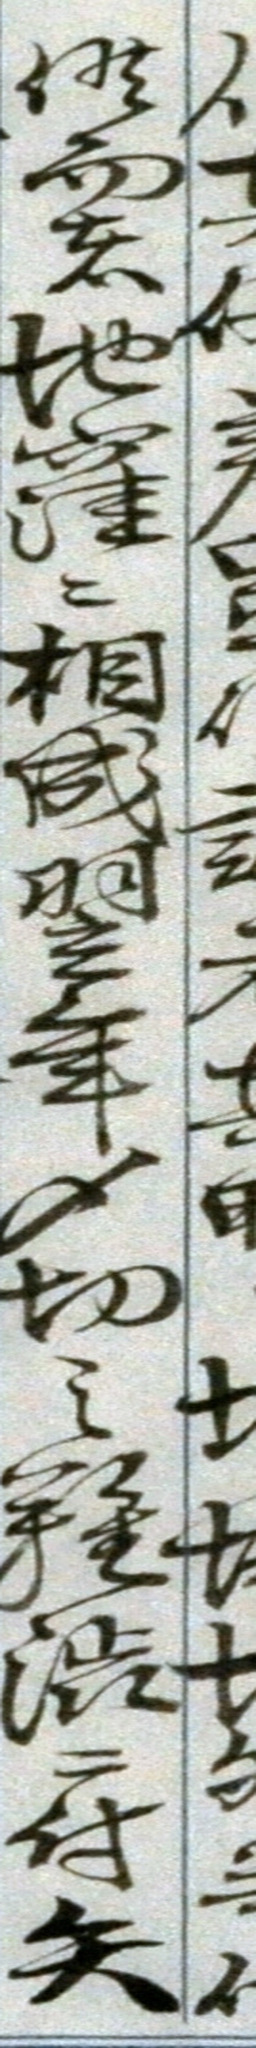者地窪ニ相成翌年〆切之難渋二付矢
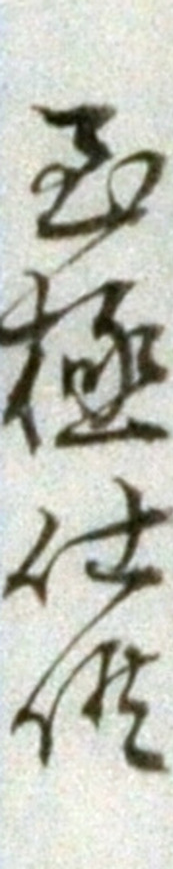至極仕候
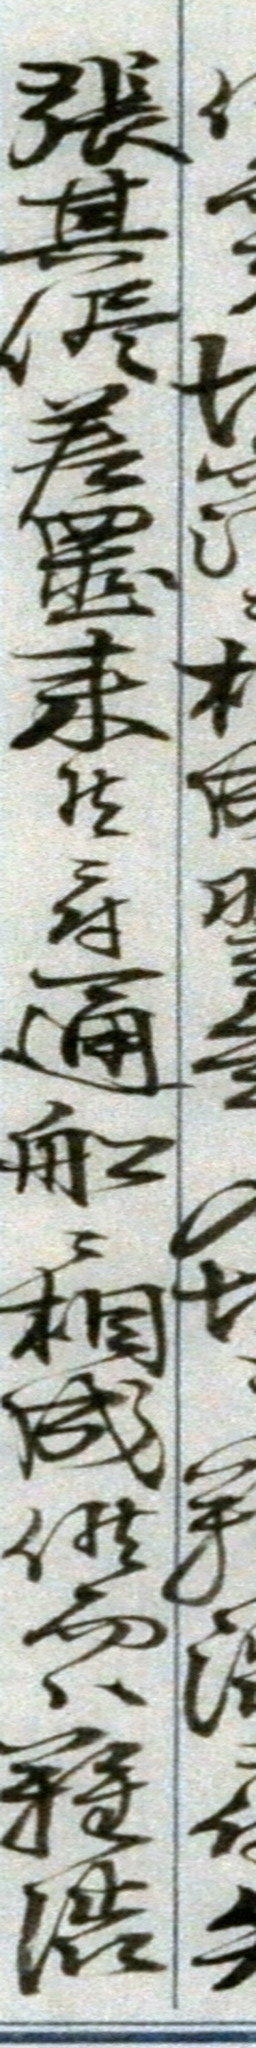張其儘差置来候二付通船二相成候而ㇵ難渋
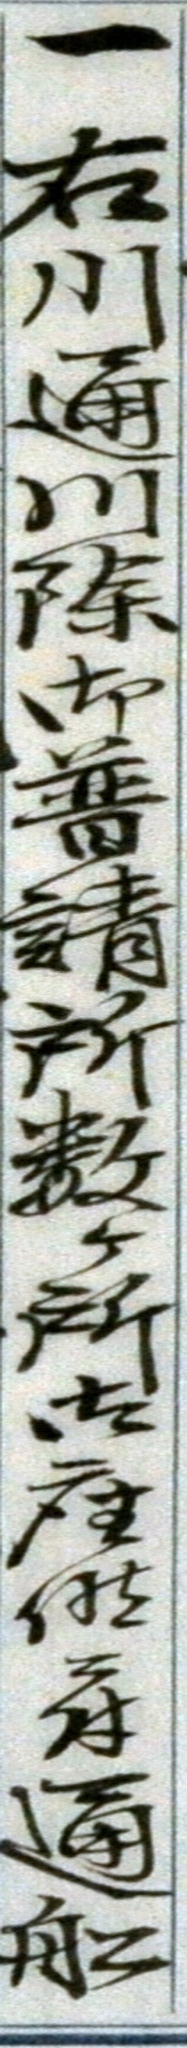一右川通川除御普請所数ケ所御座候二付通船
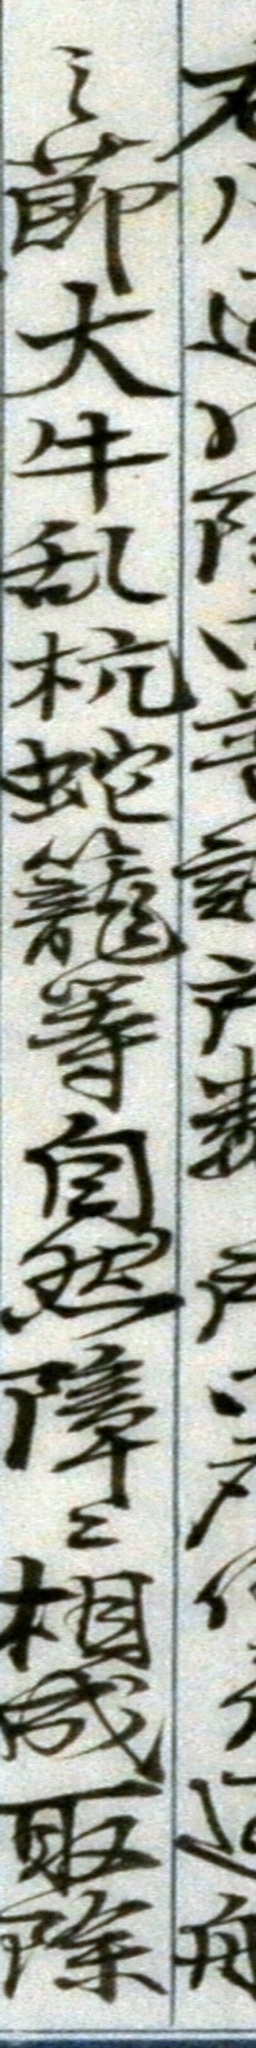之節大牛乱杭蛇籠等自然障ニ相成取除
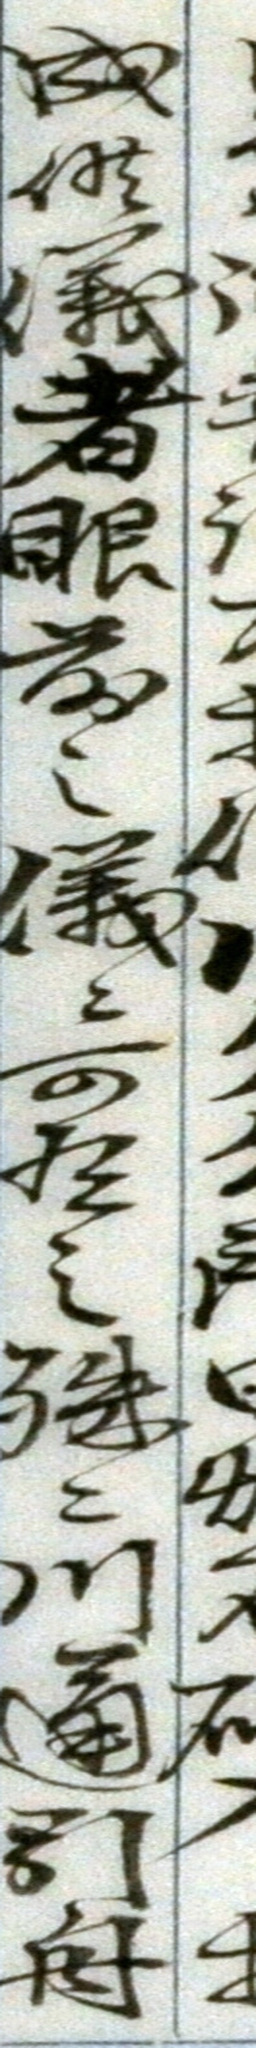成候儀者眼前之儀二可有之殊ニ川通引舟
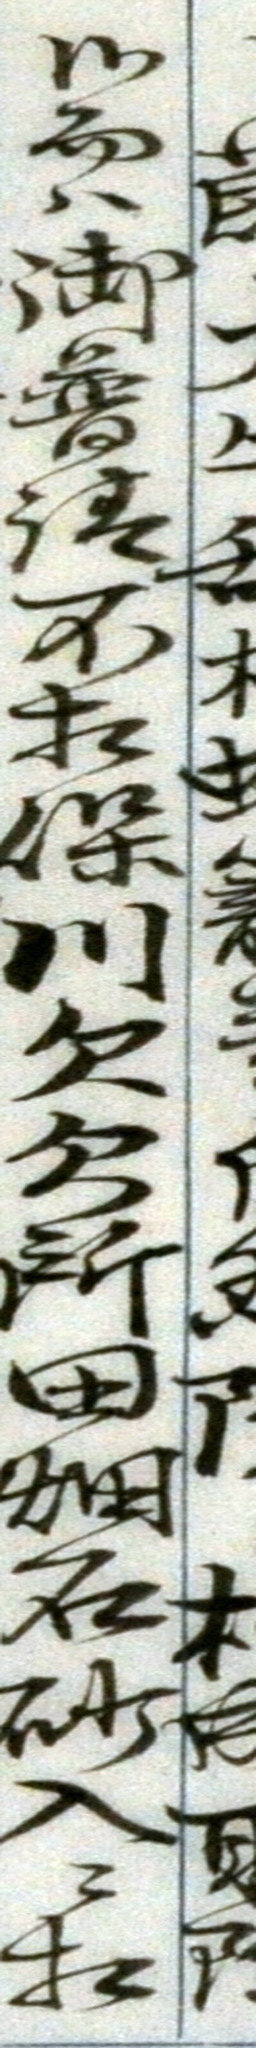候而ㇵ御普請不相保川欠欠所田畑石砂入二相
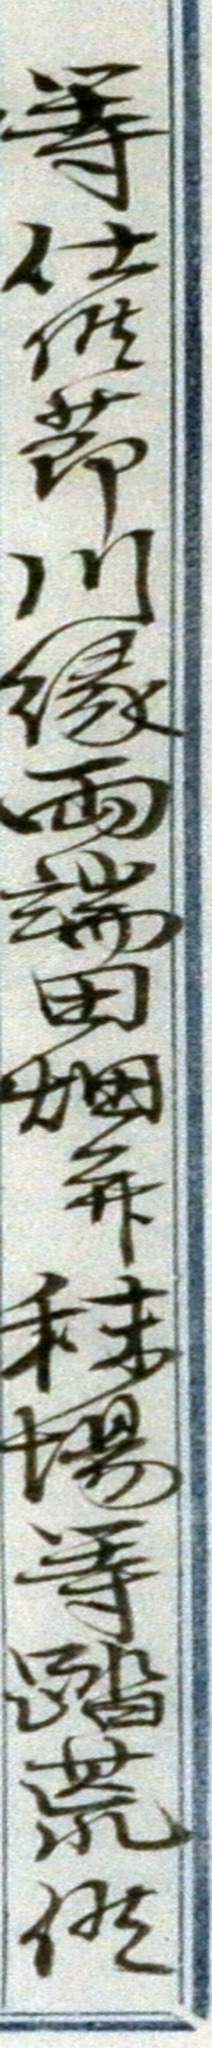等仕候節川縁両端田畑并秣場等踏荒候
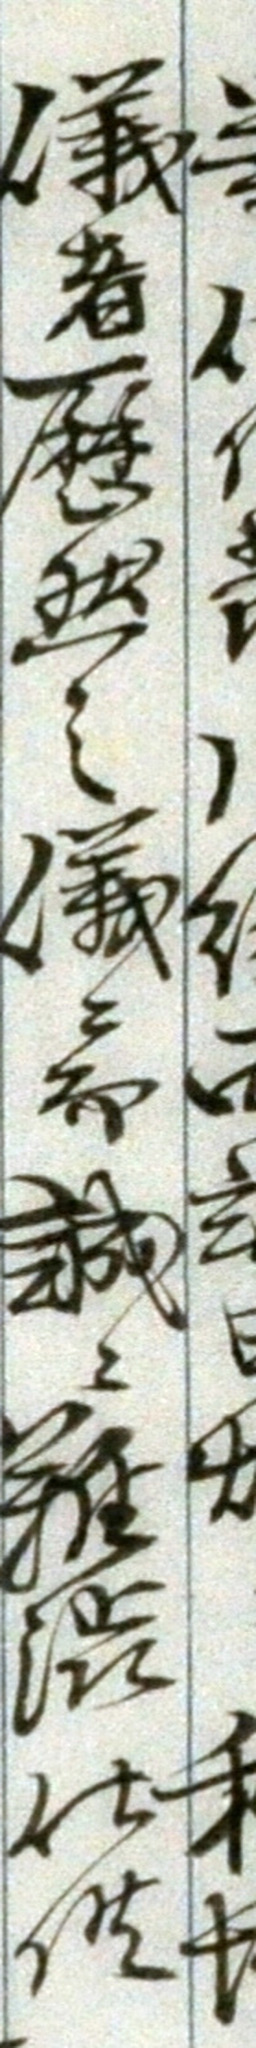儀者歴然之儀二而誠ニ難渋仕候
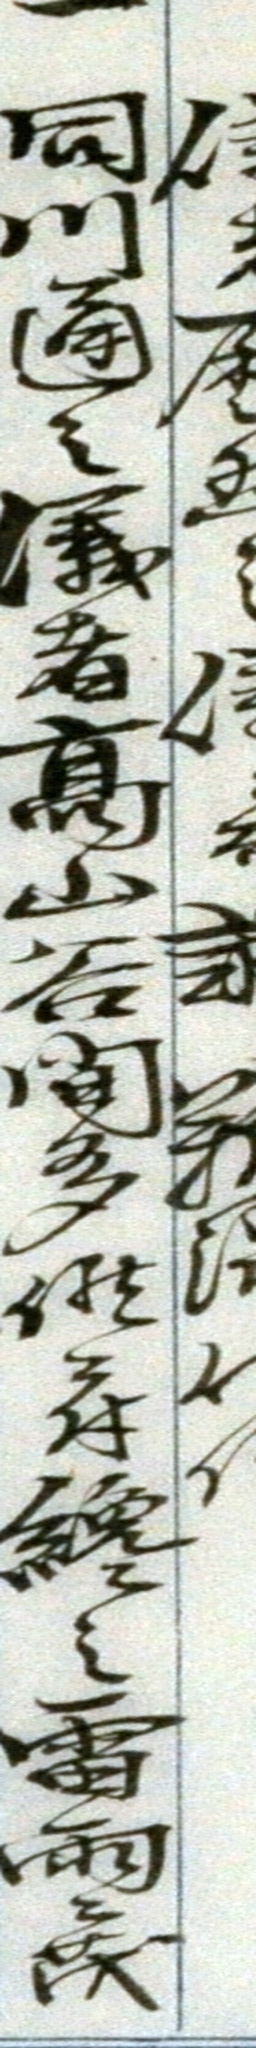一同川通之儀者高山谷間多候二纔漢字之雷雨二茂
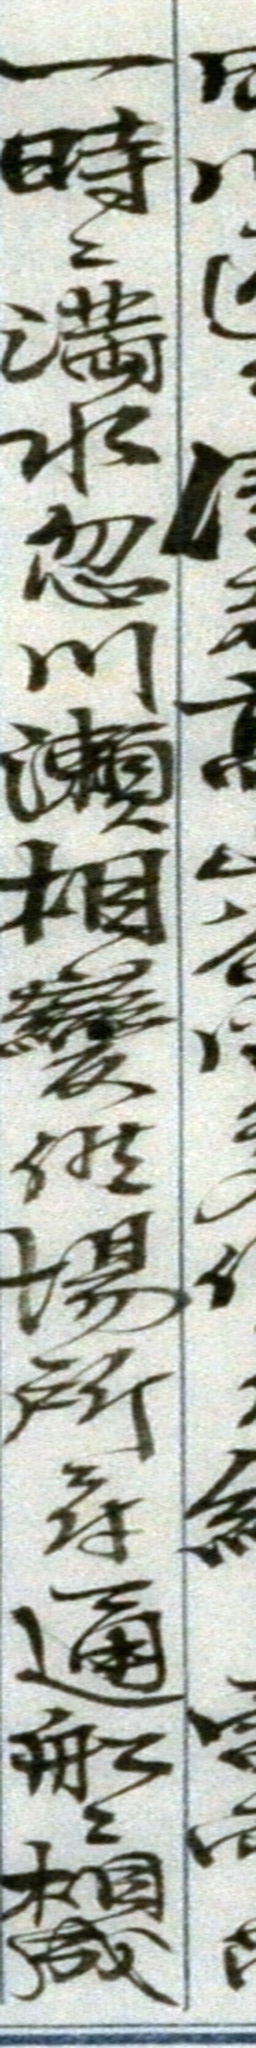一時ニ満水忽川瀬相変候場所二付通船と相成
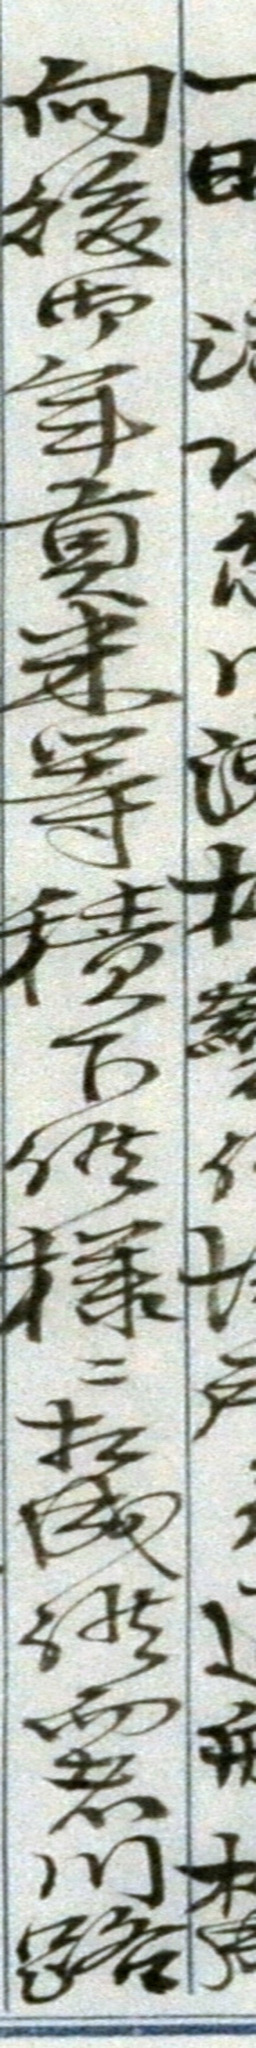向後御年貢米等積下候様二相成候而者川路
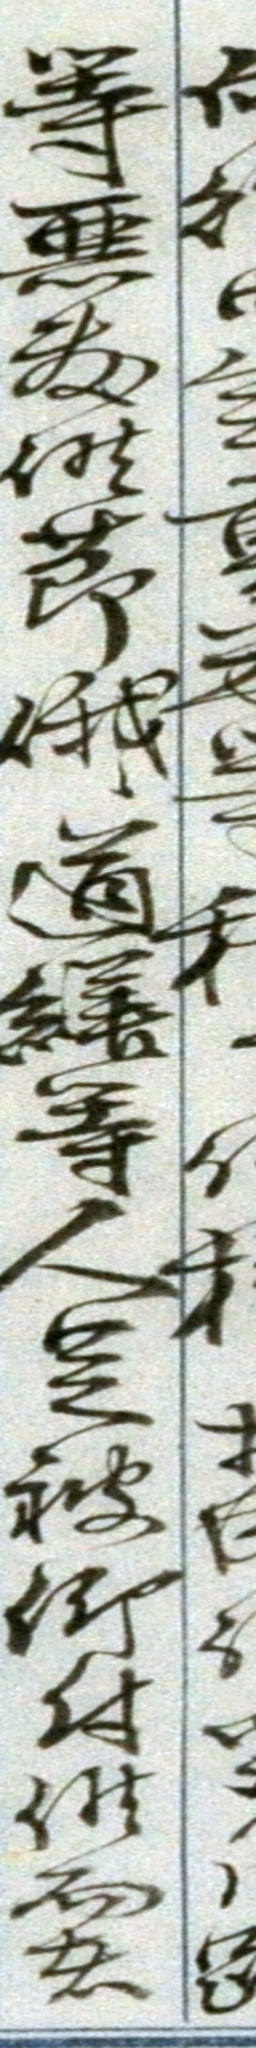等悪敷候節俄道繕等人足被仰付而者
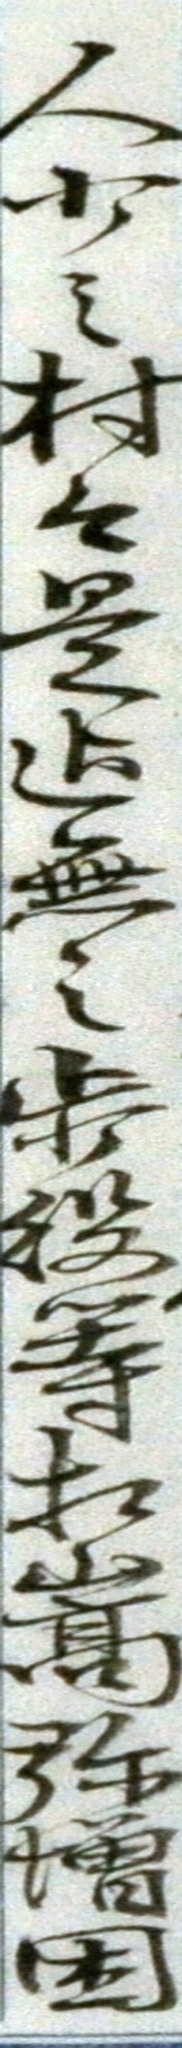人少之村々是迄無之歩役等相嵩弥増困
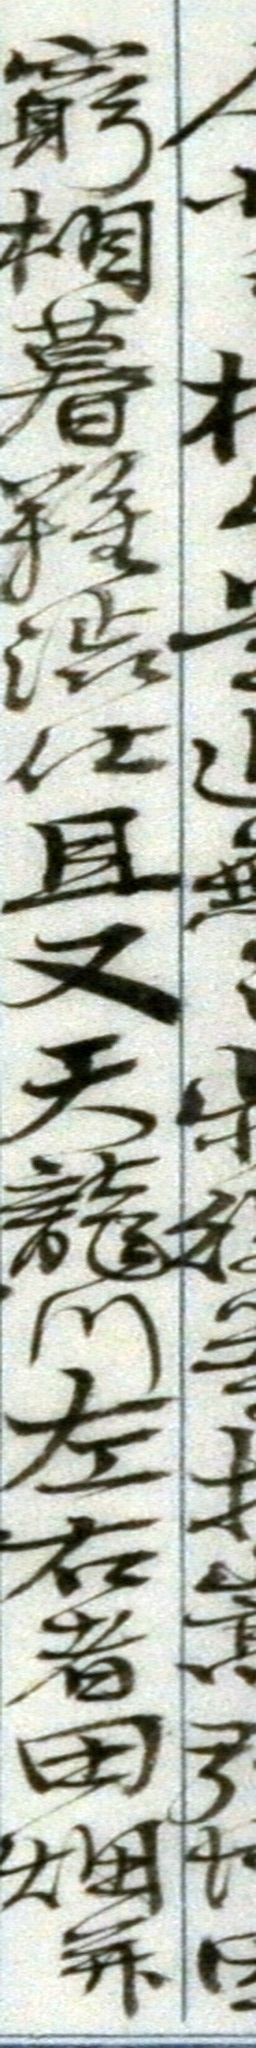窮相暮難渋仕且又天龍川左右者田畑幷
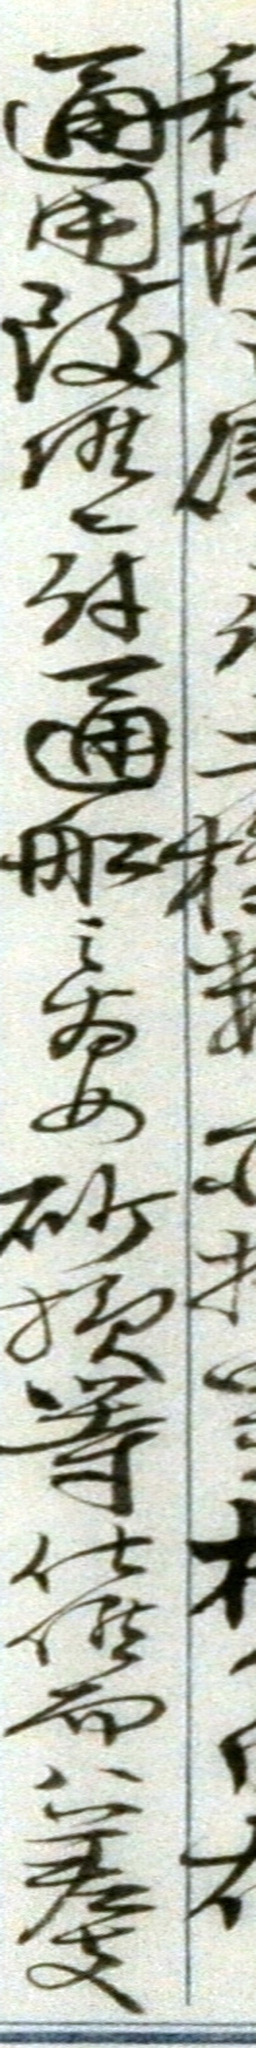通用致候二付通船之為め砂様等仕候而ㇵ差支
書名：天竜川通船難渋願并取極書
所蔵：伊那市立高遠町図書館・合同会社AMANE
